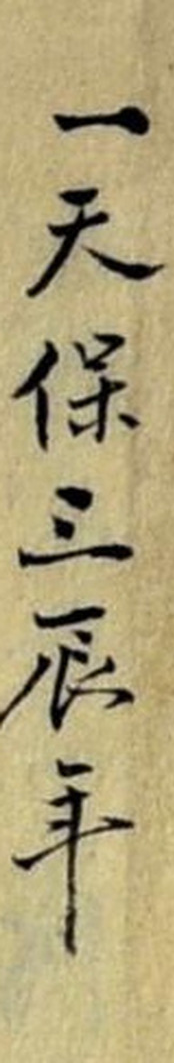一天保三辰年
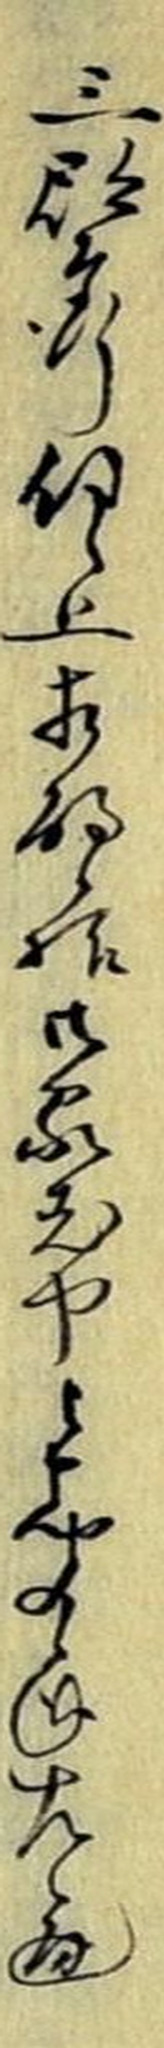三郡奉行伺之上相触候様御家老中被申聞候趣左之通
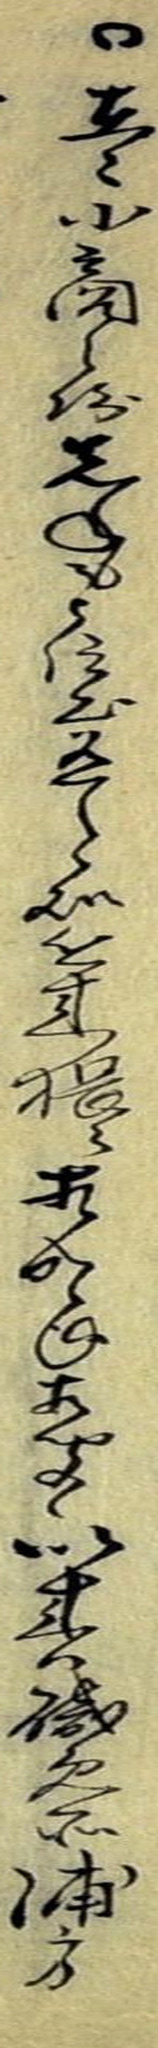〇在々小商之儀先年も被仰出有之候処近来猥ニ相成候趣相聞候以来ハ職免所浦方
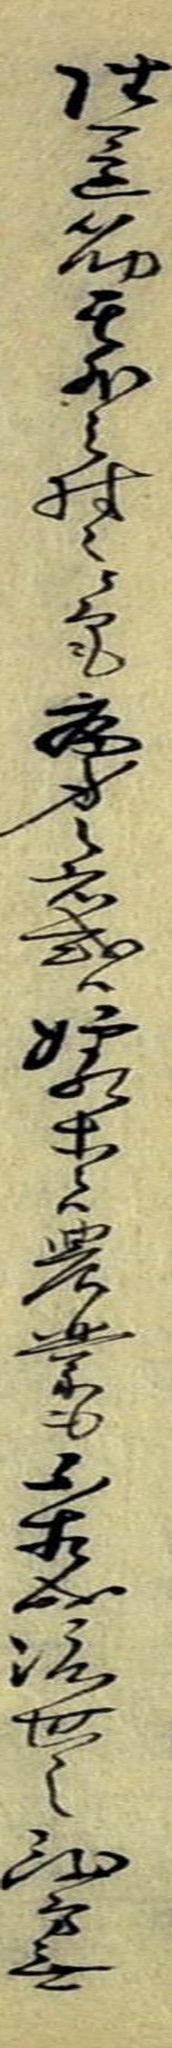往還筋其外之村々ニ而も病身之者或ハ嫁等ニハ農業も不相成渡世之致方無
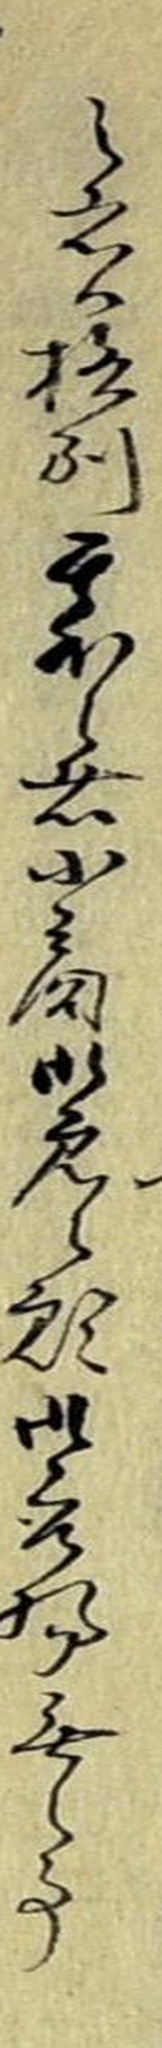之者ハ格別其外之者小商御免之願御取揚無之事
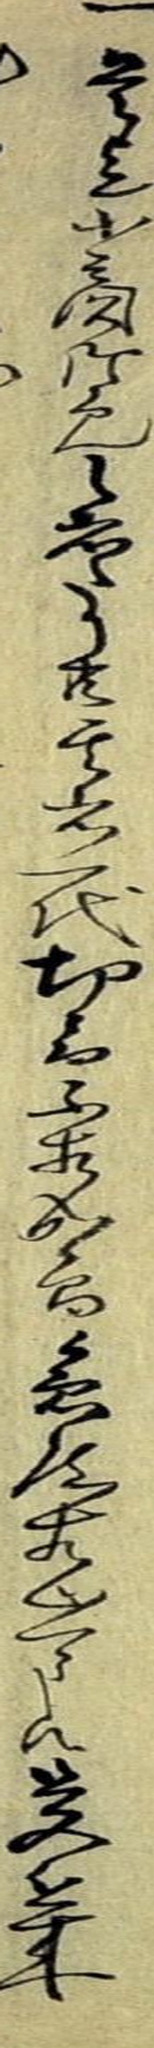一是迄小商御免之者たり共其者一代切ニ而不相成候間急度相止可申候且又近来
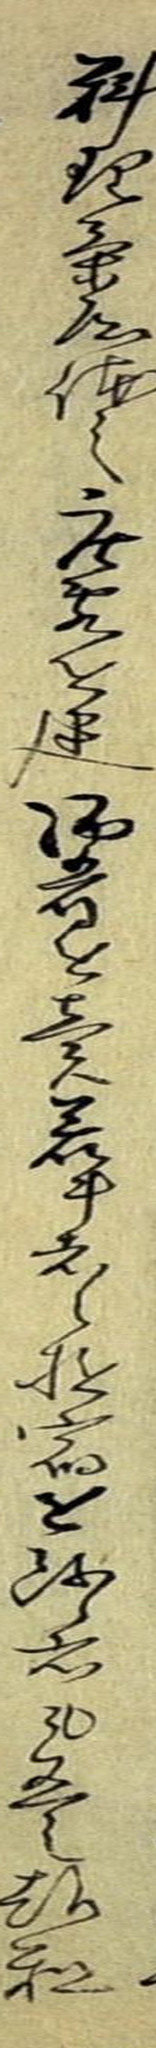料理茶屋体之座敷を建酒肴を売若キ者之遊宿を致候者も有之趣粗
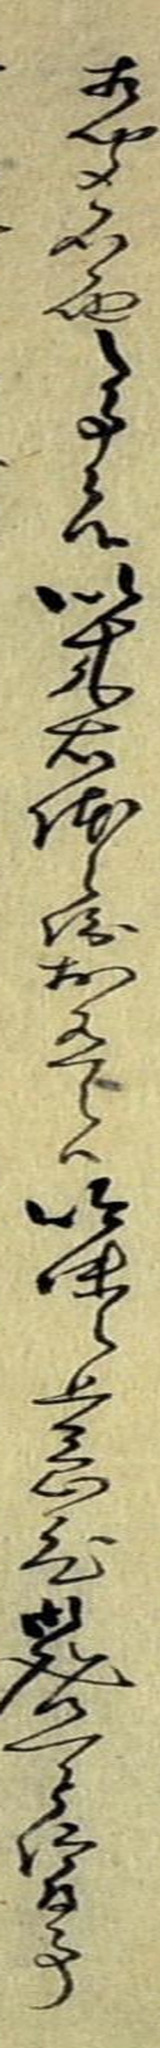相聞不届之事ニ候以来右体之儀於有之ハ吟味之上急度御咎可被仰付事
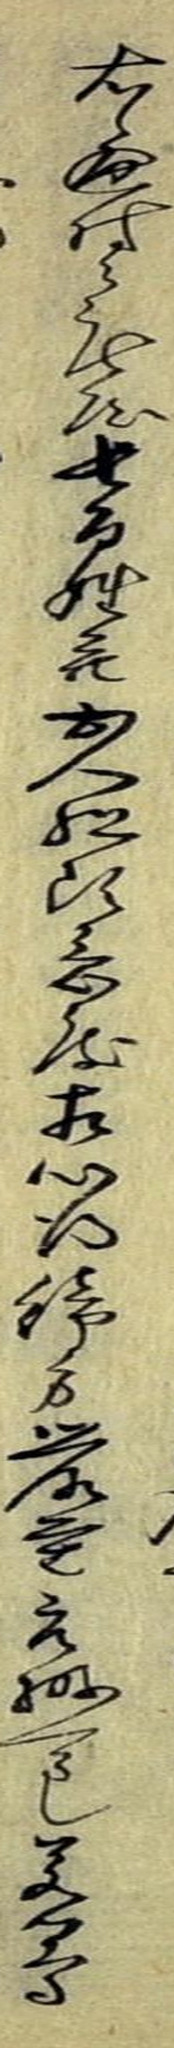右之通り村々庄屋長百姓并五人組頭急度相心得締方厳重取扱可申候若等
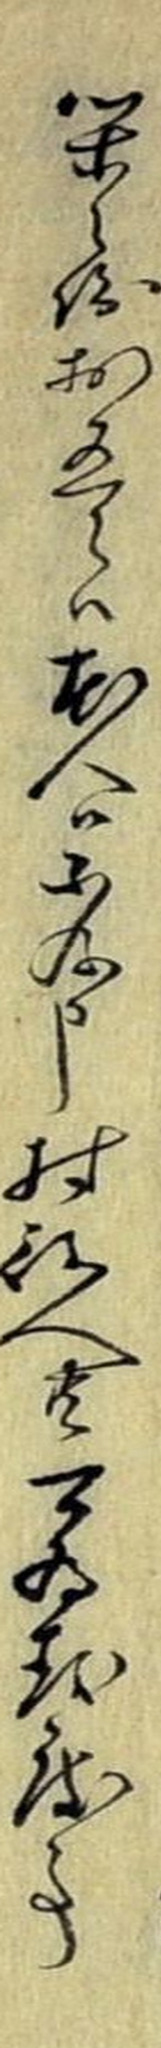閑之儀於有之ハ本人ハ不及申村役人共可為越度事
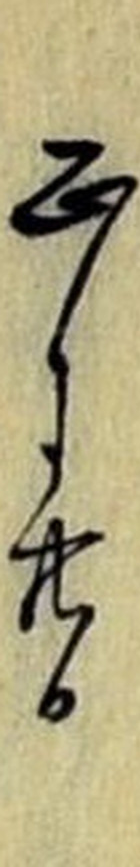正月廿日
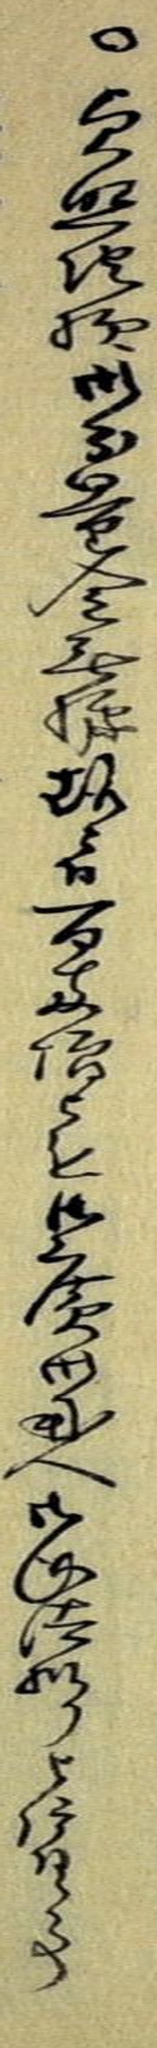〇貞照院様御分量金無拠趣ニ付百両増被進御広御用人御趣法掛り被仰付候事
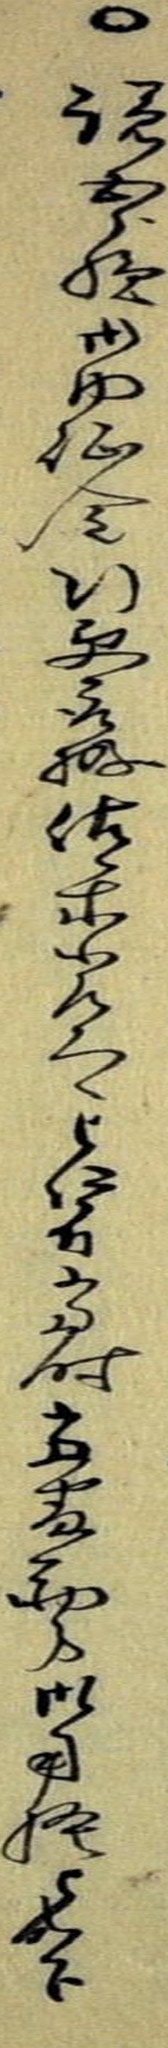〇謙五郎様御内証金引受取扱佐々木小左衛門へ被仰付当時当番勤方御用捨被成下
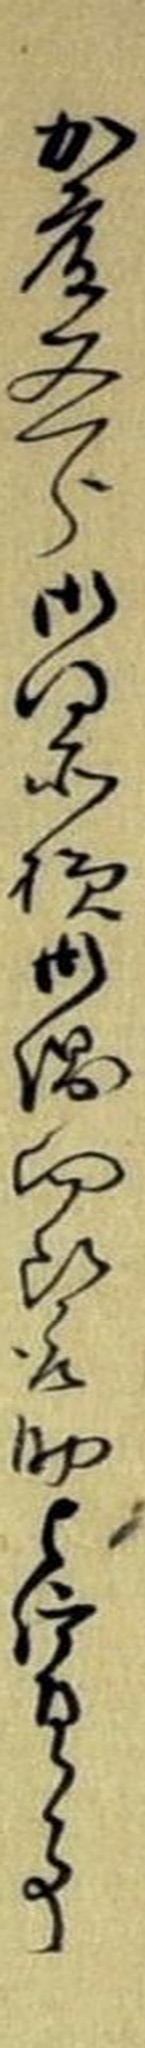加藤又一郎御同所様御側向頭取助被仰付候事
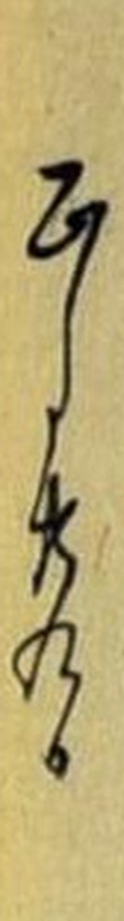正月廿九日
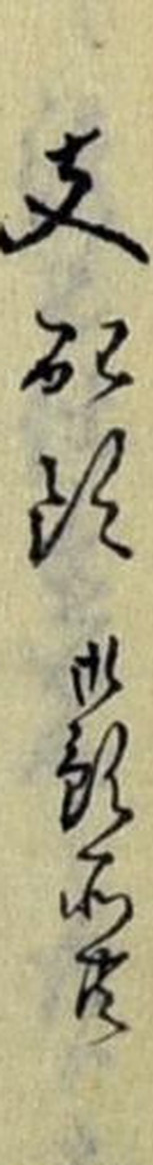支配頭御預所共
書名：命令之部 五
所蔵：福井県文書館 Fukui Prefectural Archives
